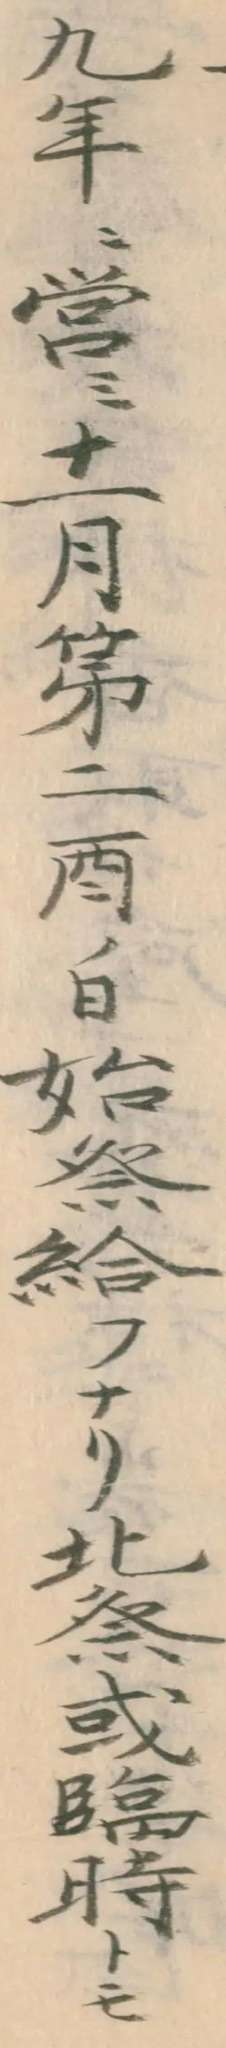九年ニ営ミ十一月第二酉ノ日始祭給フナリ北祭或臨時トモ
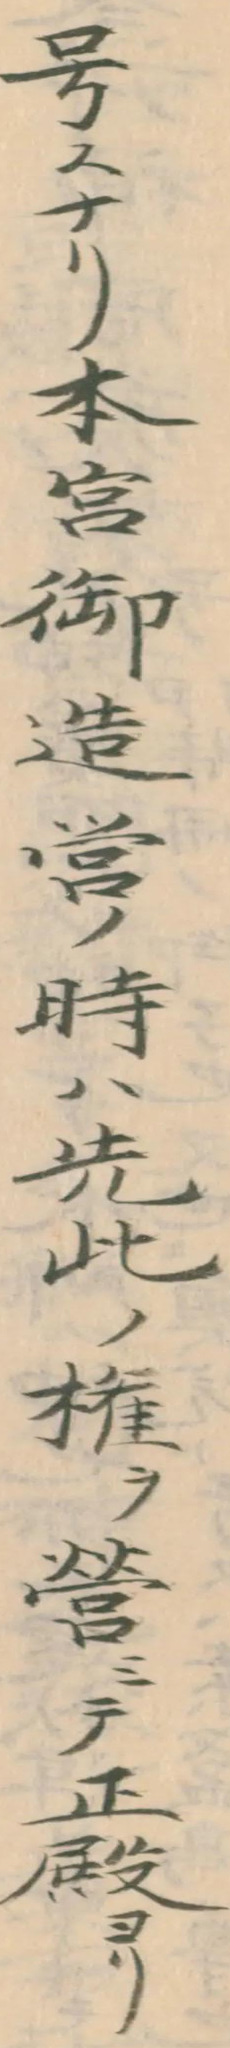号スナリ本宮御造営ノ時ハ先此ノ権ヲ営ミテ正殿ヨリ
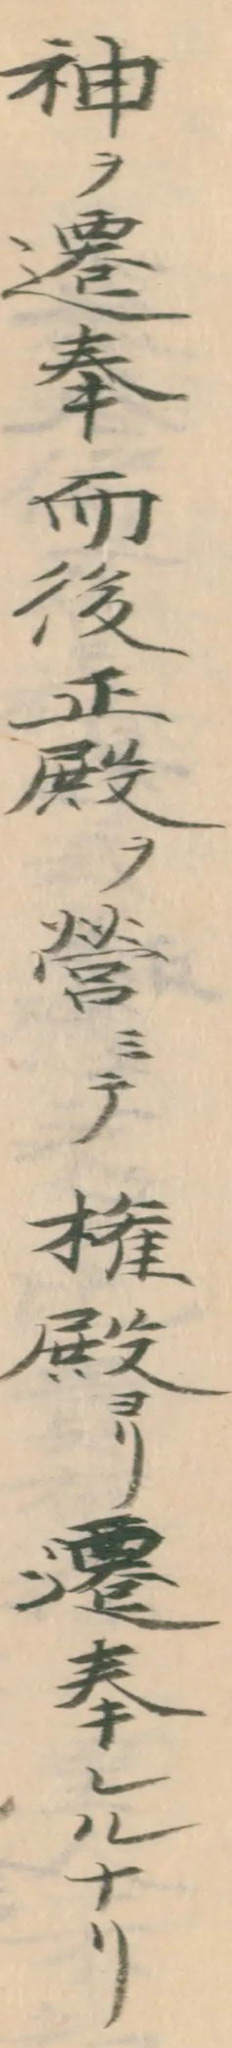神ヲ遷奉而後正殿ヲ営ミテ権殿ヨリ遷奉レルナリ
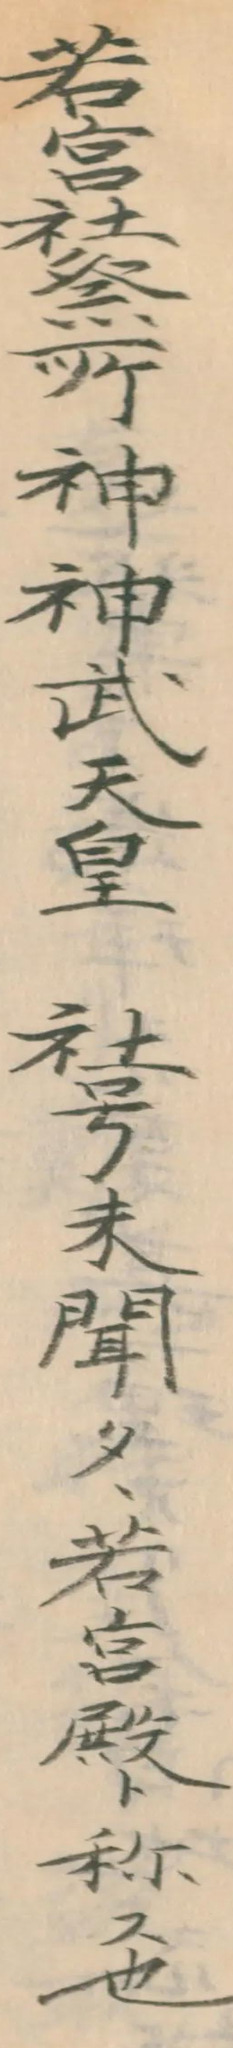若宮社祭所神神武天皇社号未聞タヽ若宮殿ト称ス也
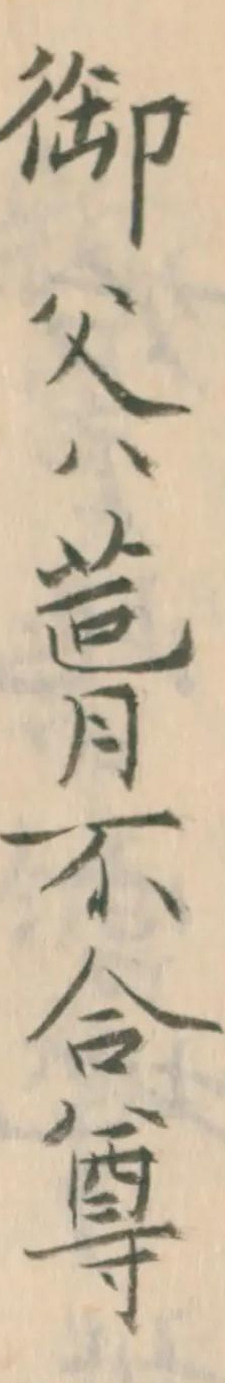御父ハ葺不合尊
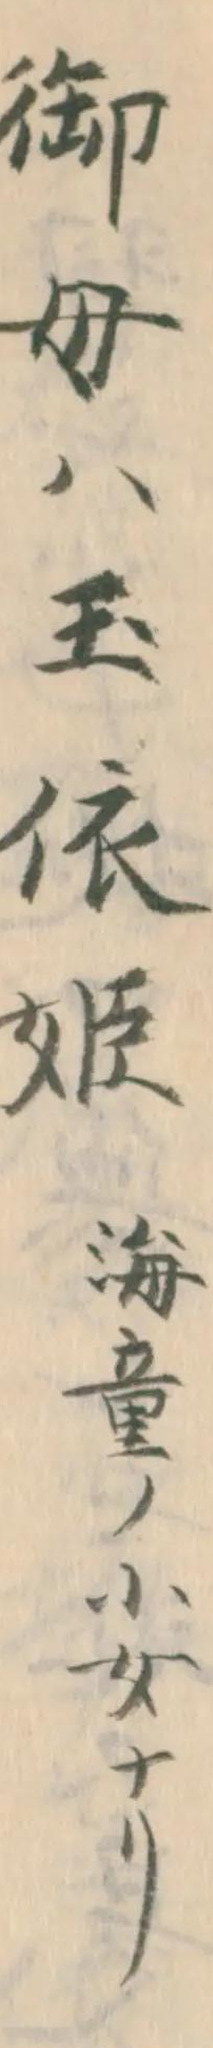御母ハ玉依姫海童ノ小女ナリ
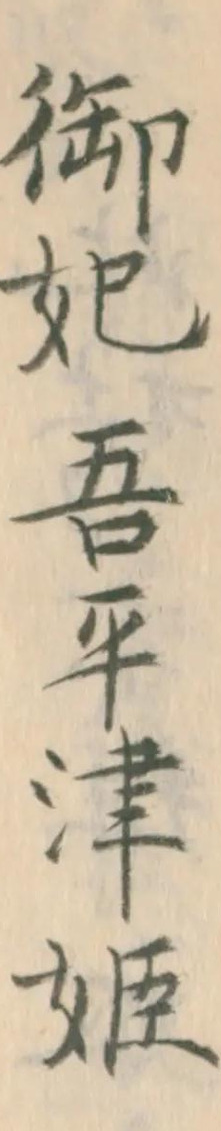御妃吾平津姫
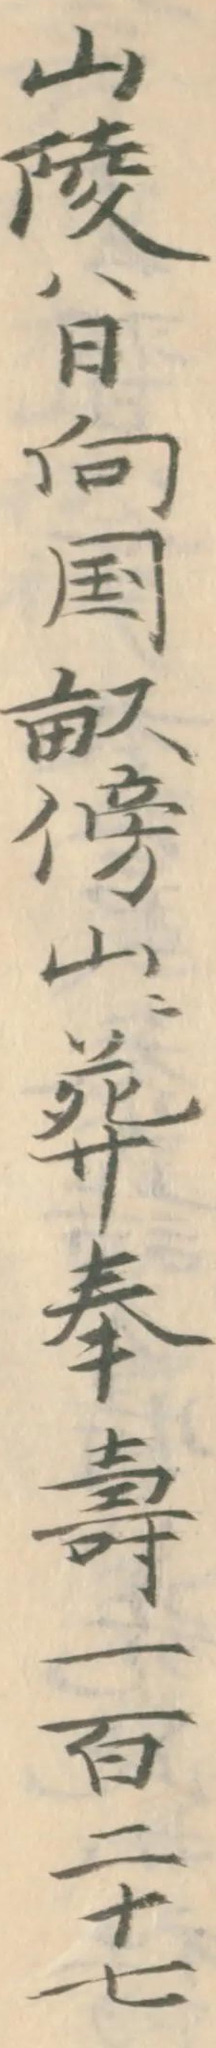山陵ハ日向国畝傍山ニ葬奉寿一百二十七
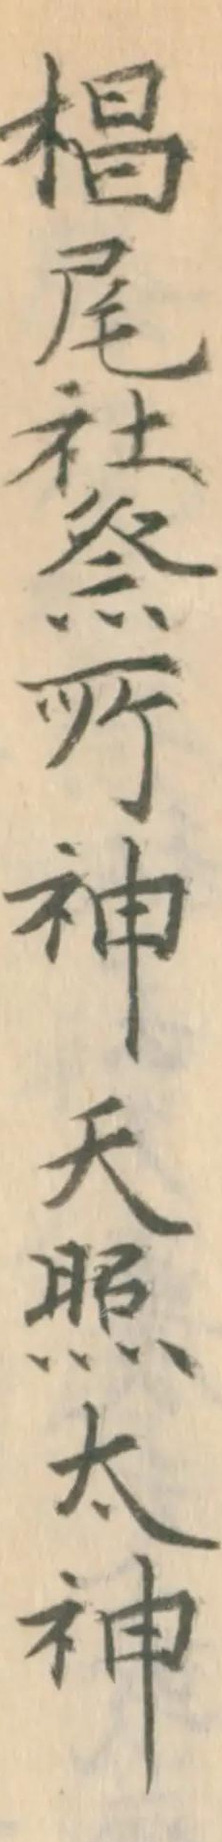杉尾社祭所神天照太神
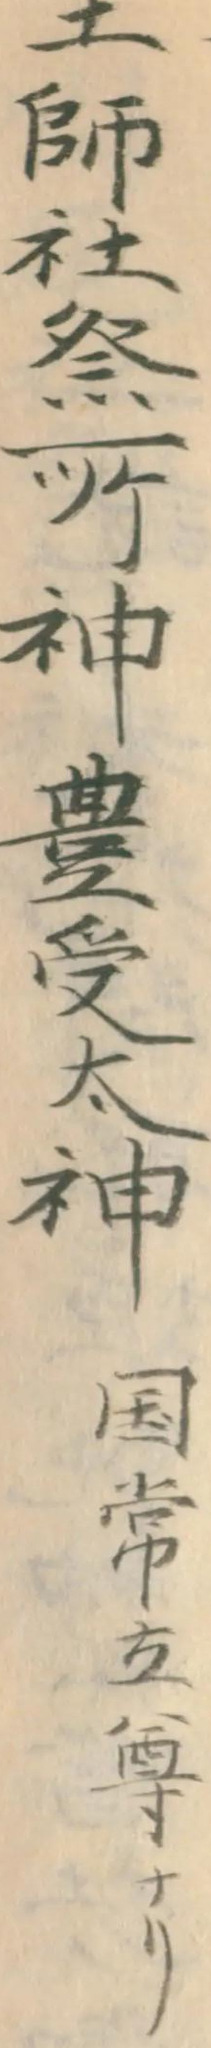土師社祭所神豊受太神国常立尊ナリ
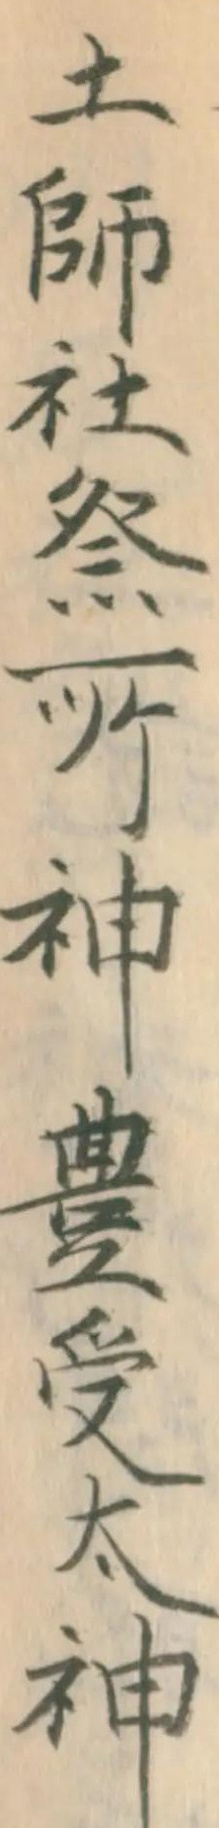杉尾社祭所神天照太神
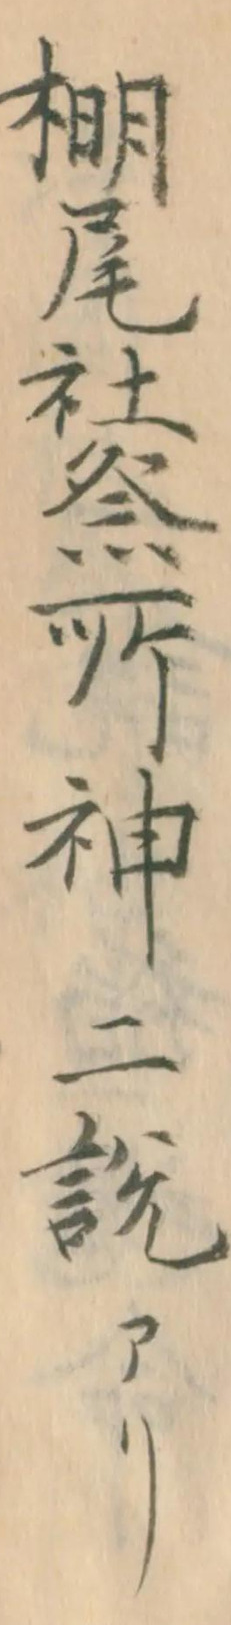棚尾社祭所神二説アリ

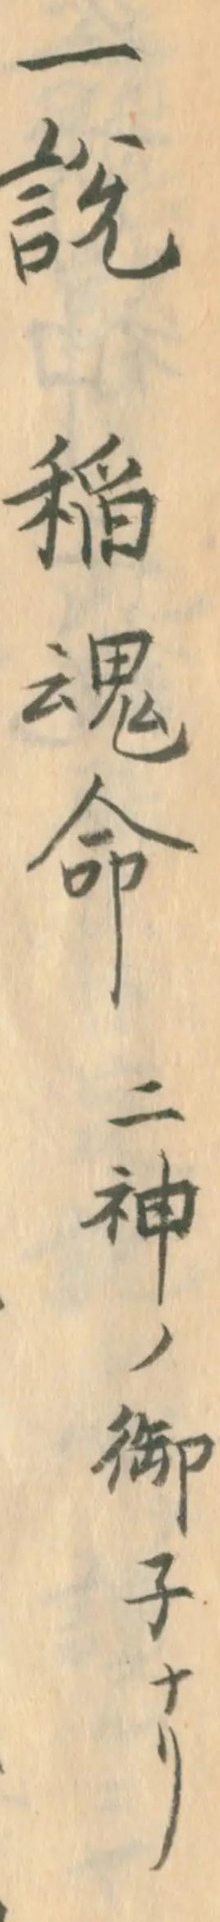一説稲魂命二神ノ御子ナリ
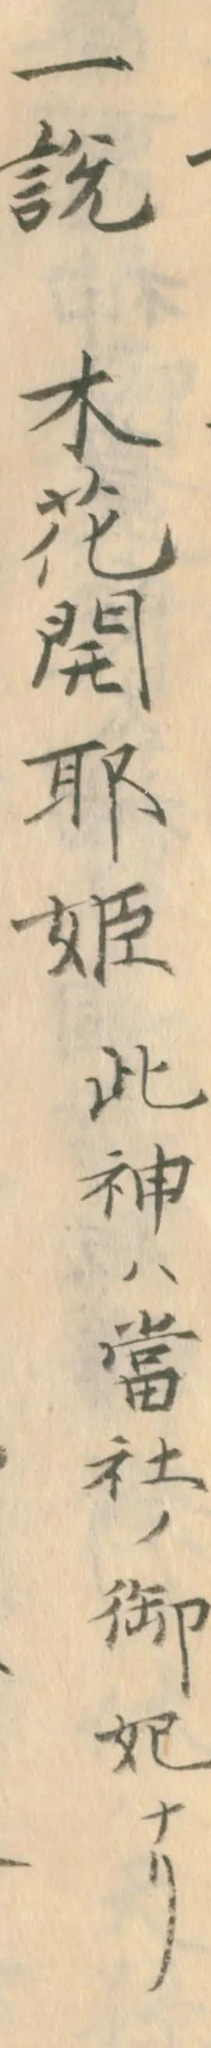一説木花開耶姫此神ハ当社ノ御妃ナリ
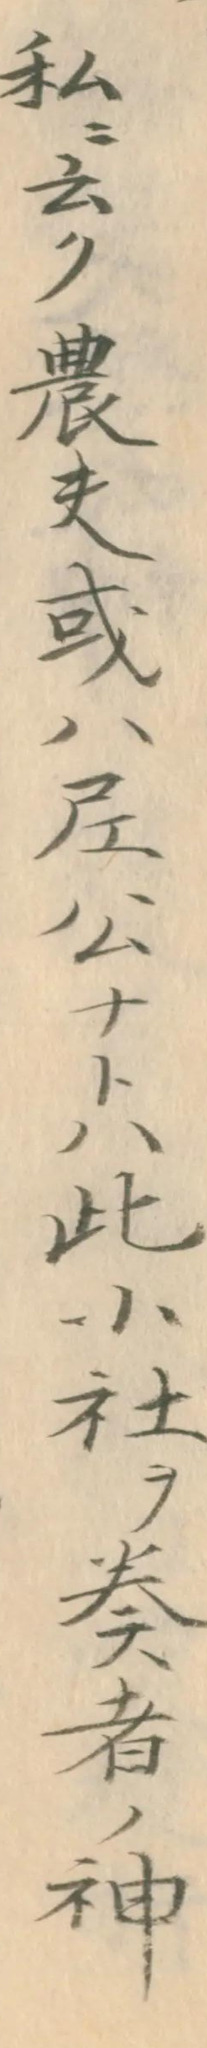私ニ云ク農夫或ハ尼公ナトハ此小社ヲ奏者ノ神
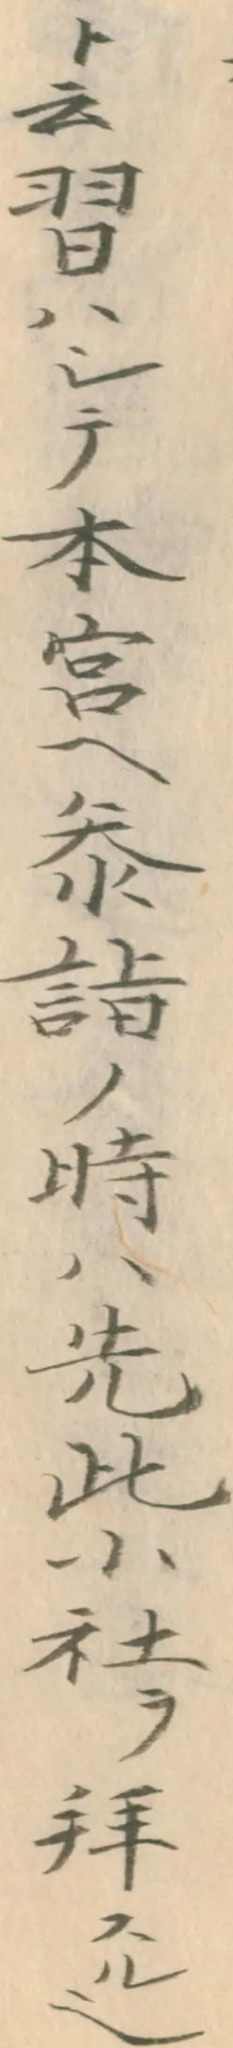ト云習ハシテ本宮ヘ参詣ノ時ハ先此小社ヲ拝スル也
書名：賀茂社記録. 第91冊
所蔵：国立国会図書館 National Diet Library, JAPAN
